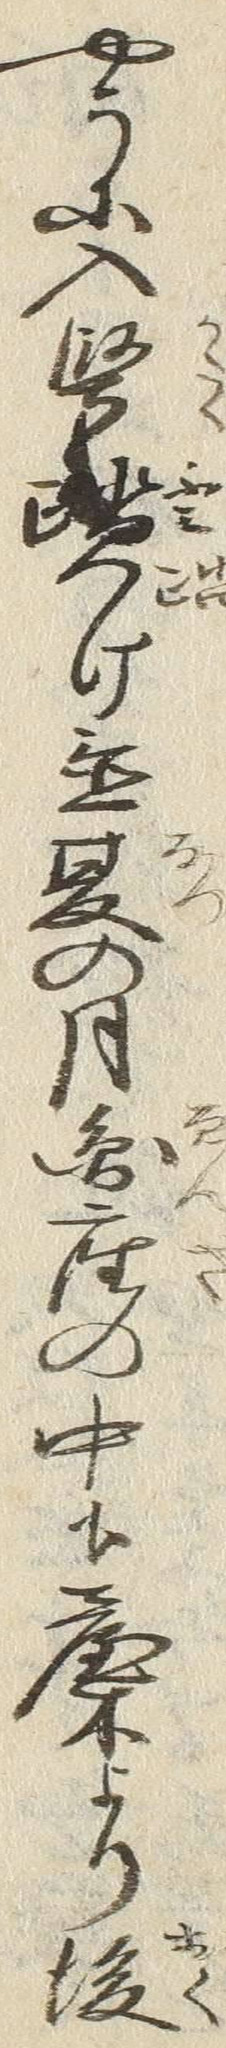やう尓入堅踏つけ置夏の月圓座の中江臺木より後
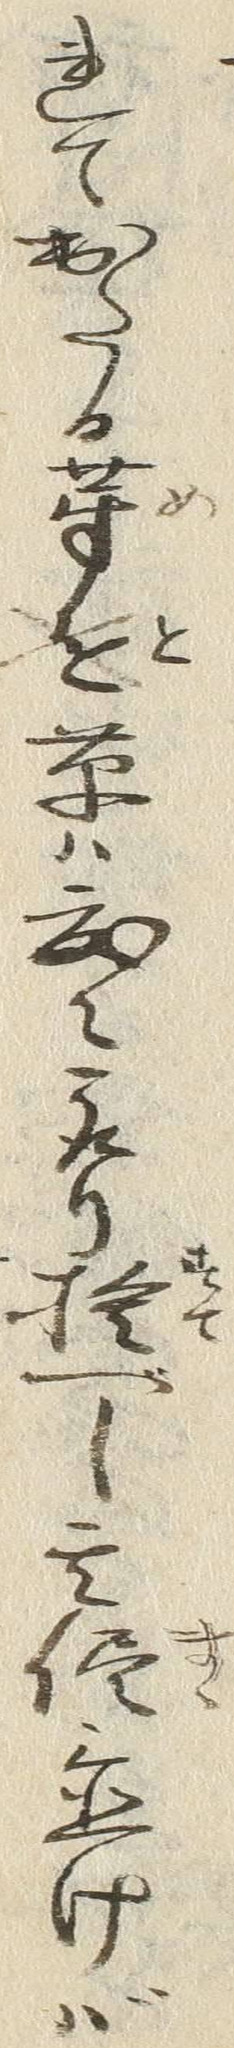連て出たる芽と草は度々取り捨べし其侭置けば
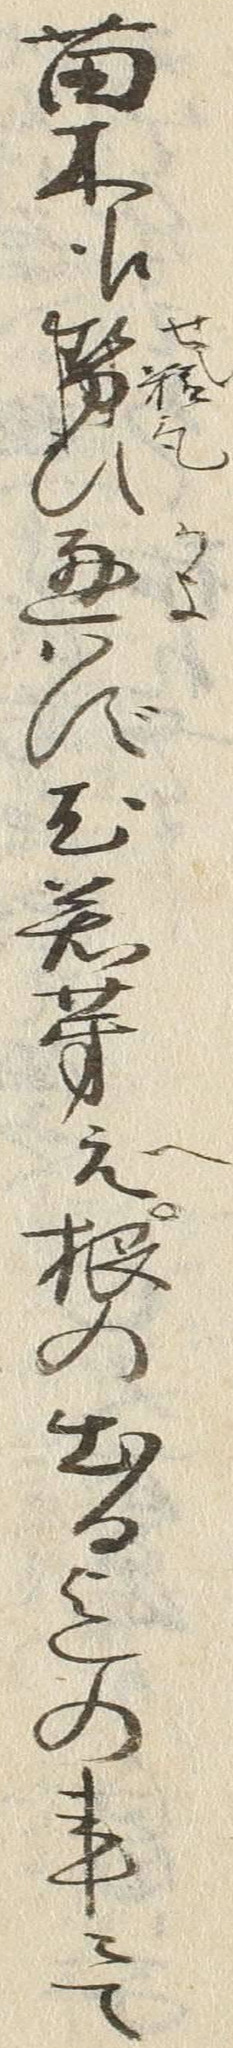苗木江精気通はず尤若芽へ。根の出る迄の事にて
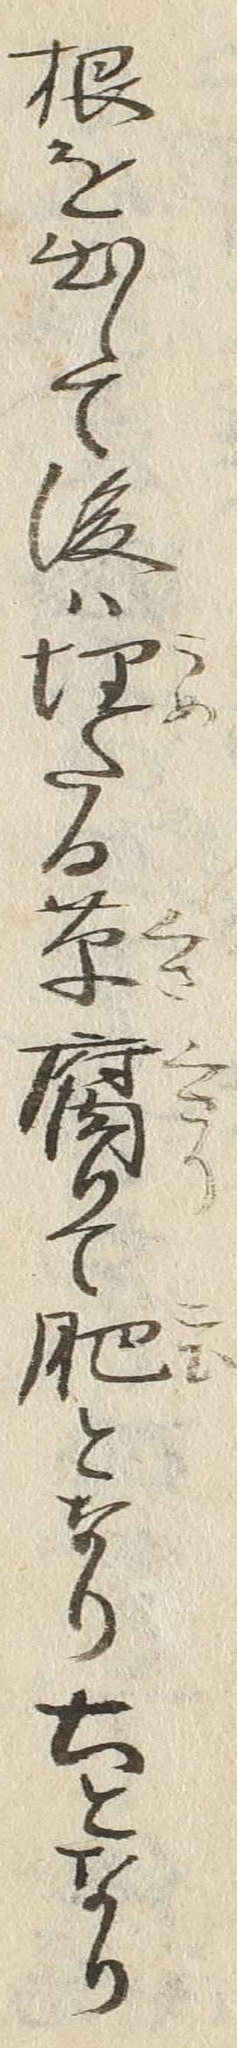根を出して後は埋たる草腐りて肥となり土となり
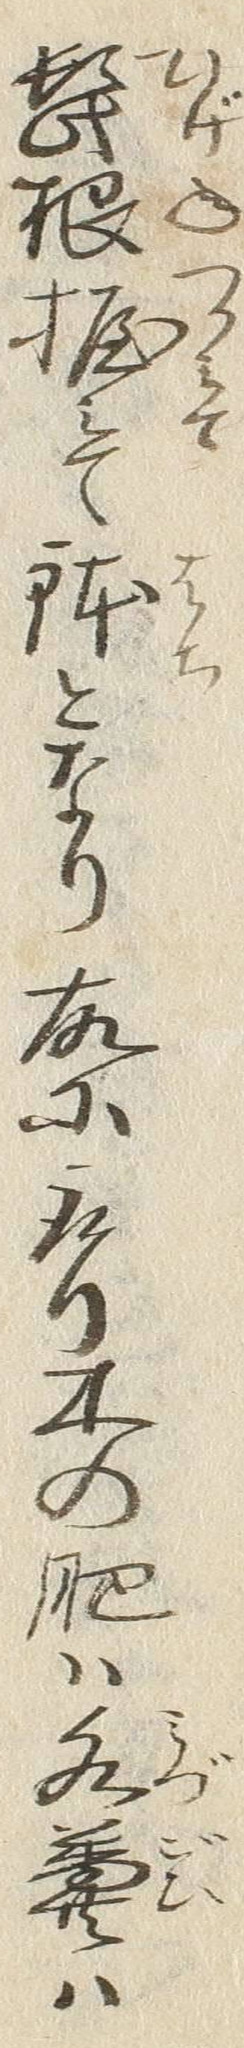髭根握みて鉢となり故尓取り木の肥は水糞は
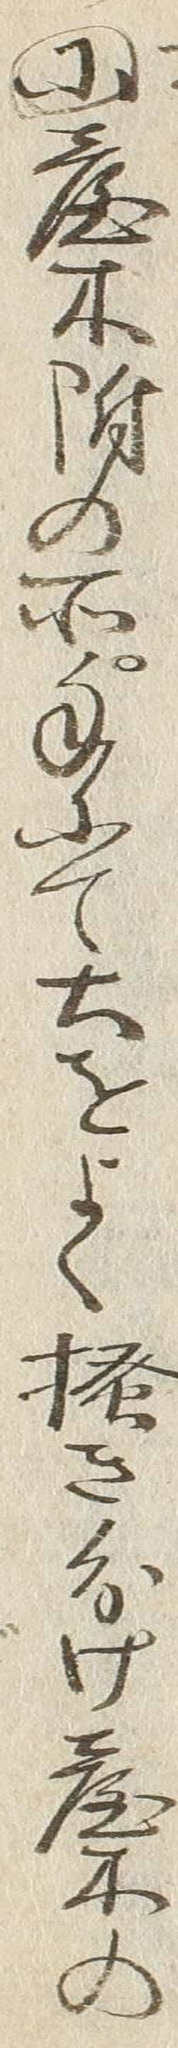早々臺木附の所。手尓て土をよく掻き分け臺木の
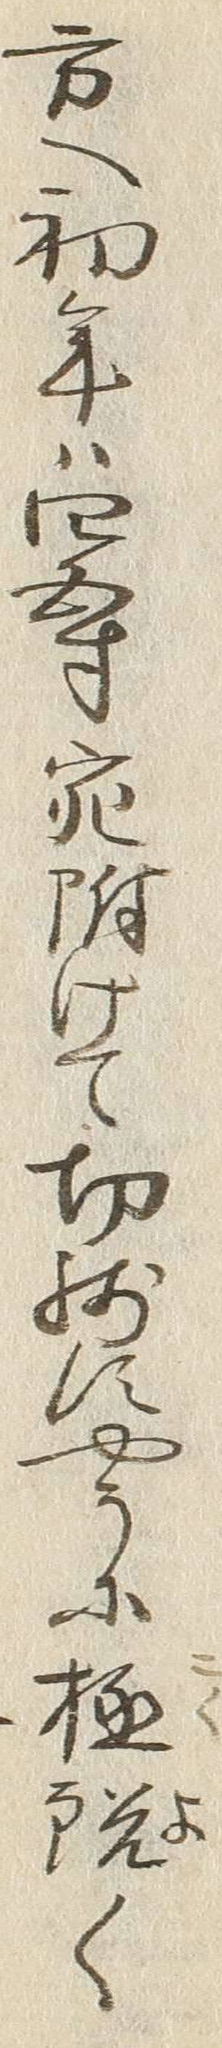方へ初年は四五寸宛附けて切残須やう尓極鋭く
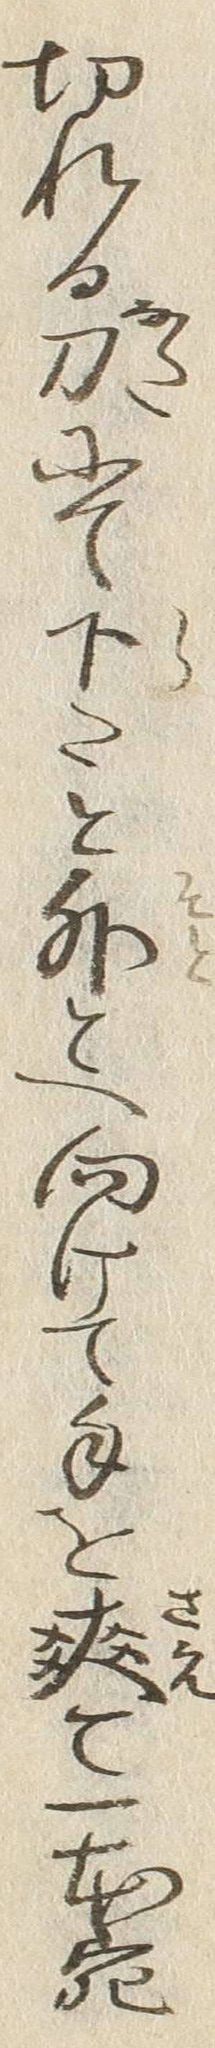切れる刀尓て下たと外とへ向けて手を爽て一本宛
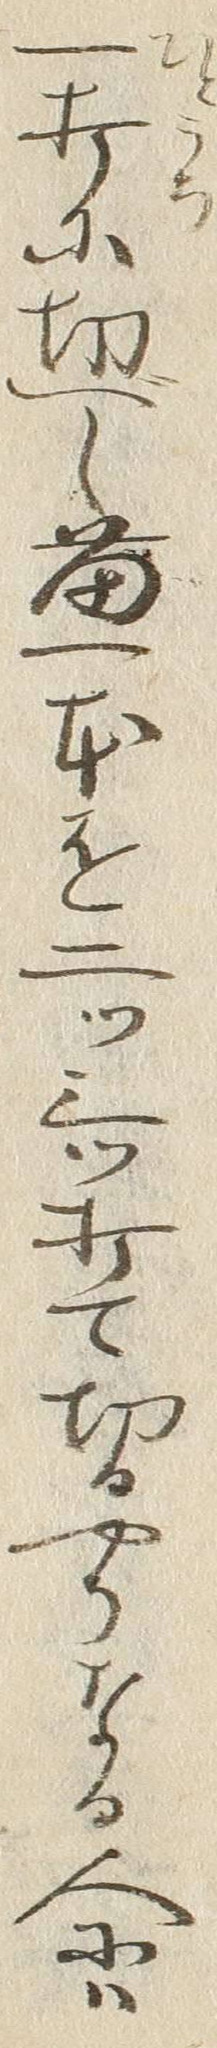一打尓切べし苗一本を二ツ三ツ打て切るやうなる人尓は
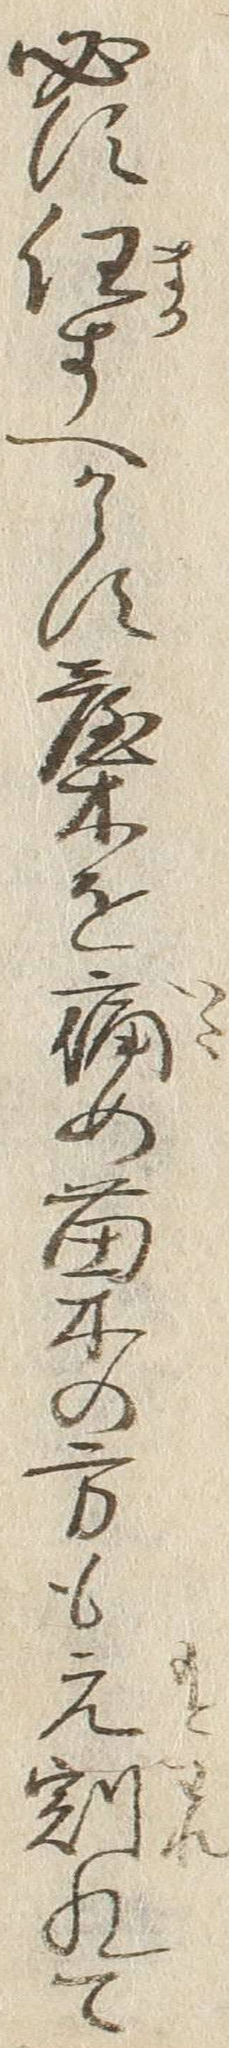必須任すへから須臺木を痛め苗木の方も元割れて

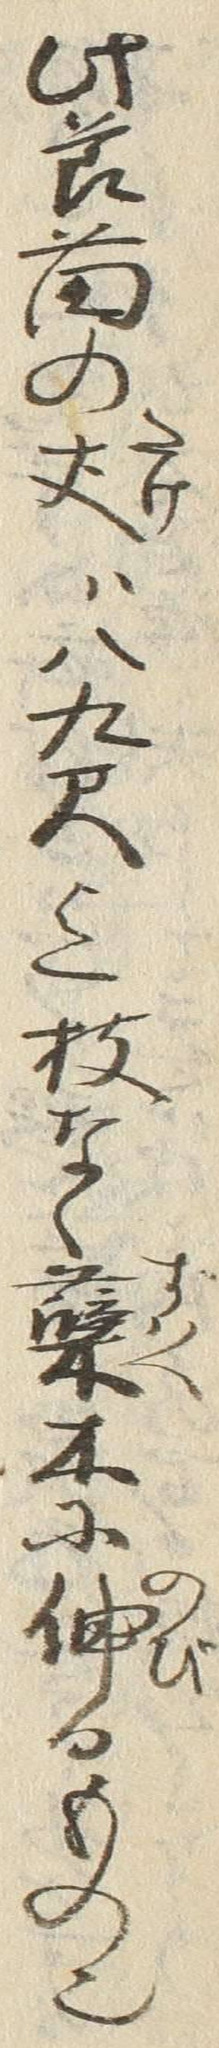此節苗の丈は八九尺迄枝なく蘖木尓伸るもの也
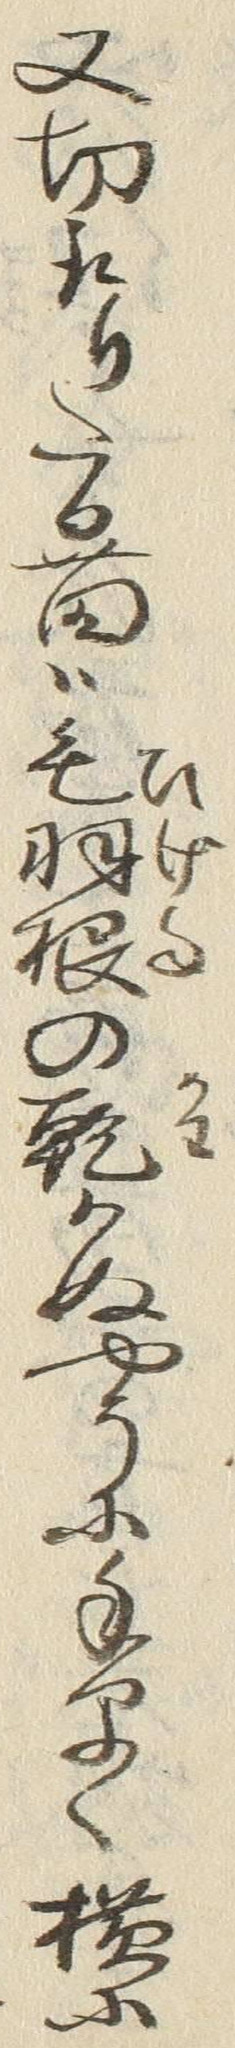又切取りたる苗は毛羽根の乾かぬやう尓手早く横尓
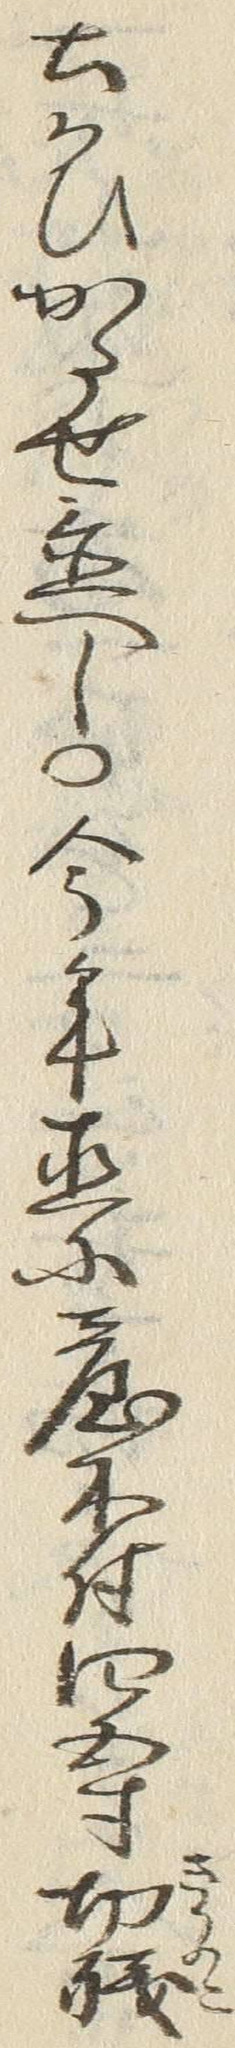土かひかたせ置へし〇今年直尓臺木付四五寸切残
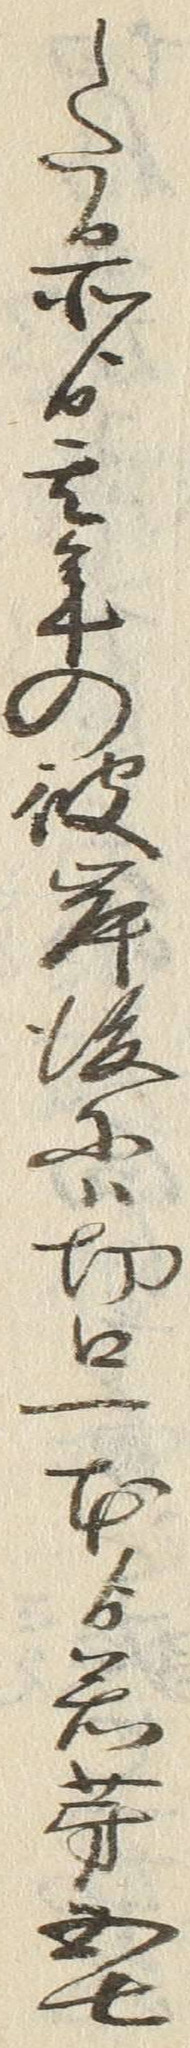したる所ゟ其年の彼岸後尓は切口一本ゟ若芽五七
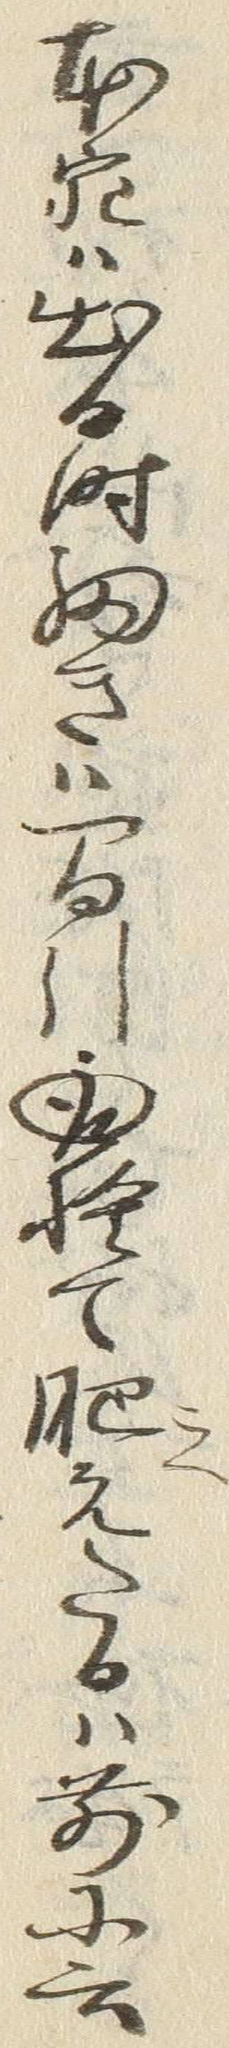本宛は出る時細きは間引捨て肥えたるは前尓云
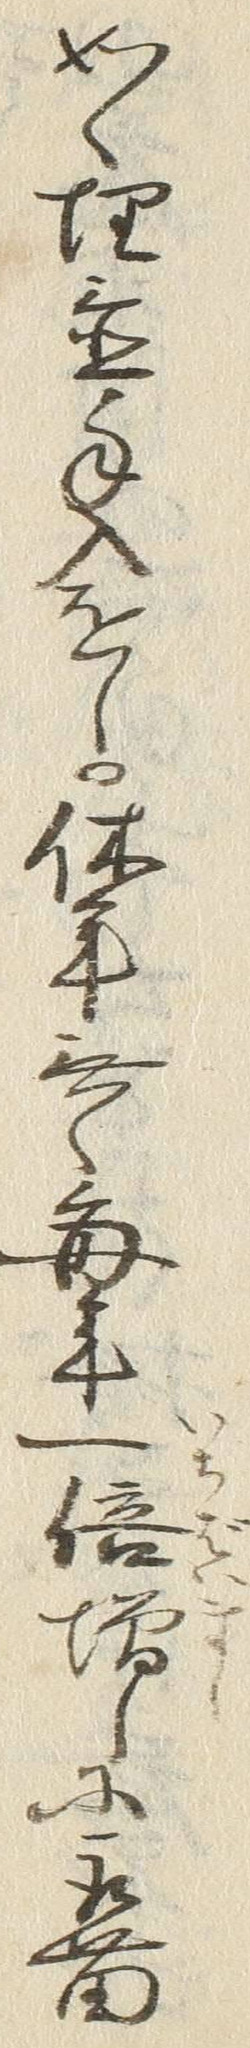如く埋置手入をし〇休年無く毎年一倍増し尓取苗
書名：養蠶實驗録後編
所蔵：東京大学農学生命科学図書館 国文学研究資料館
